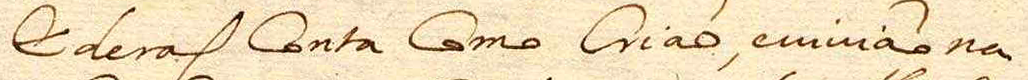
E deraõ Conta Como Criaõ, e uiuiaõ na
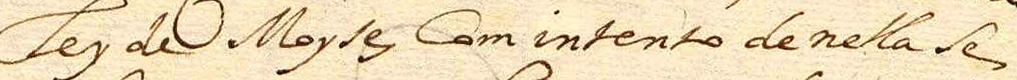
Ley de Moyses Com intento de nella se
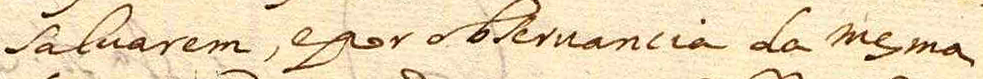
saluarem, e por obseruancia da mesma
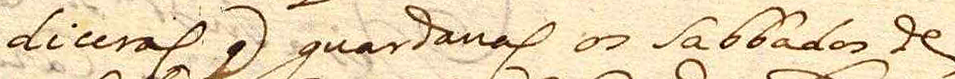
diceraõ q̄ guardauaõ os sabbados de
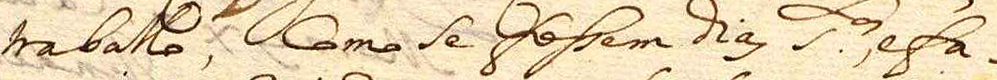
trabalho, Como se fossem dias s.tos e fa
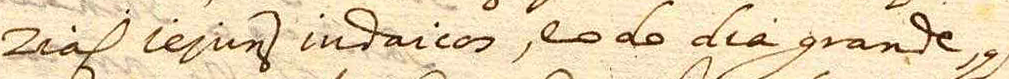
ziaõ iejuns iudaicos, e o do dia grande, q̄
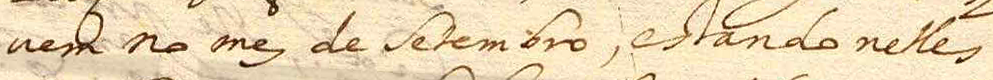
uem no mes de Setembro, estando nelles
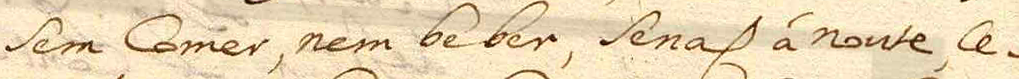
Sem Comer, nem beber, senaõ á noute, ce
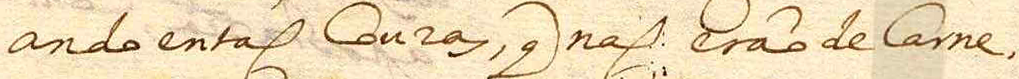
ando entaõ couzas, q̄ naõ eraõ de Carne.
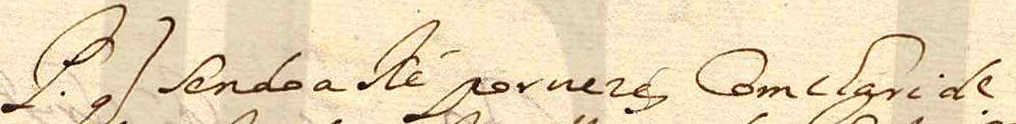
P. q̄ Sendo a Ré por uezes Com charid.e
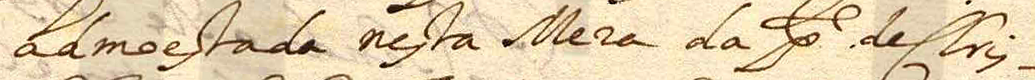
admoestada nesta Meza da p.te de Chris
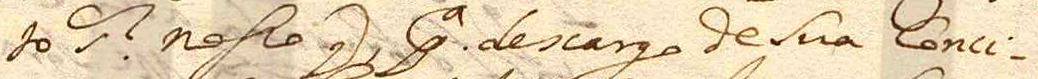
to s.or NoSso q̄, p.a descargo de sua Conci
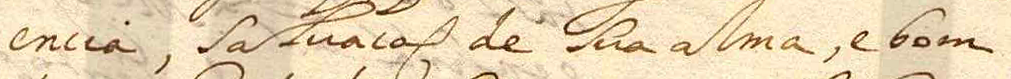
encia, saluaçaõ de sua alma, e bom
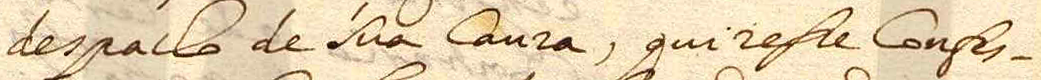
despacho de sua Cauza, quizesse Confes
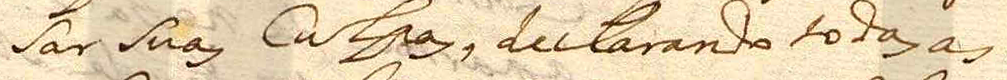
sar suas Culpas, declarando todas as
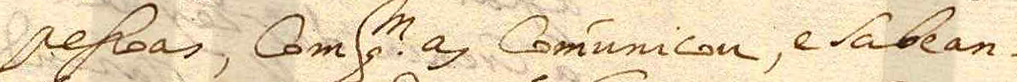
pessoas, Com q.m as Com̄unicou, e sabe an
